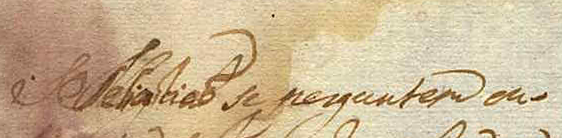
S Sebastiaõ se perguntem ou
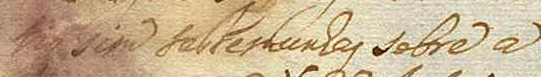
trosim testemunhas sobre a
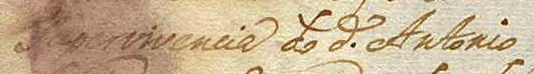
supervivencia do d.o Antonio
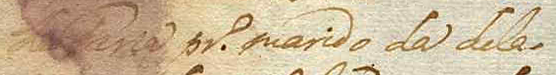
de Faria pr.o marido da dela
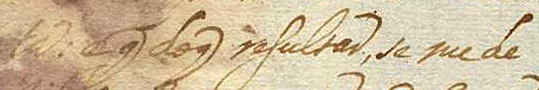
ta. e q̄ do q̄ resultar, se me de
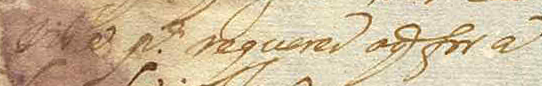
vista p.a requerer o q̄ for a
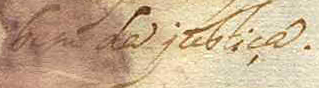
bem da justiça.
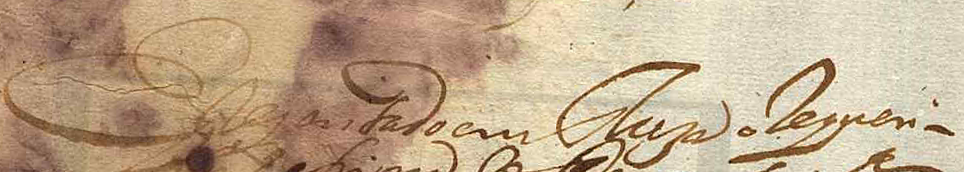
E prezentado em Meza o Requeri
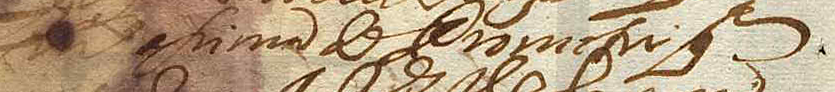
mto assima do Promotor p.a
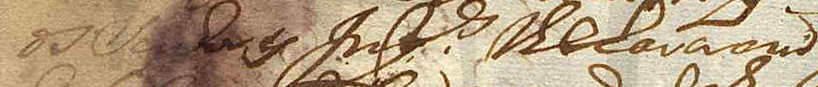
os Senhores Jnq.res lhe haverem
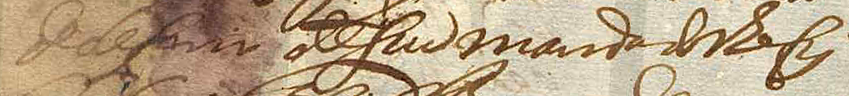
de deferir de seu mandado lhe fis
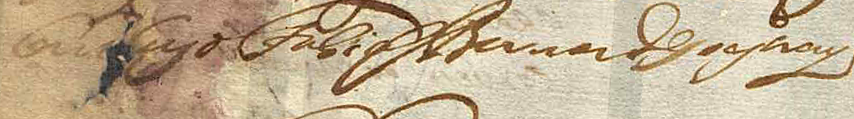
Concluso Fabião Bernardes o escreuj
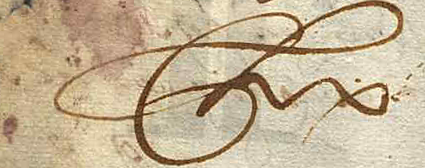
Clo
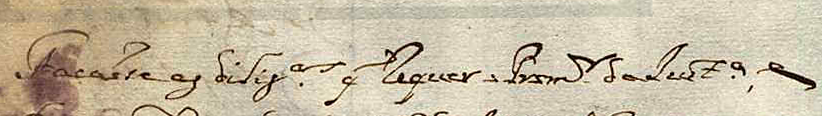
Façaõse as dilig.as q̄ Requer o Prom.or de Iust.a, e
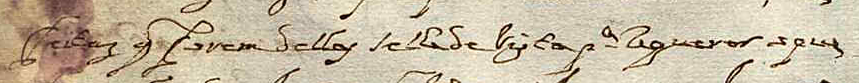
feitaz q̄ forem dellas se lhe de Vista p.a Requerer o que
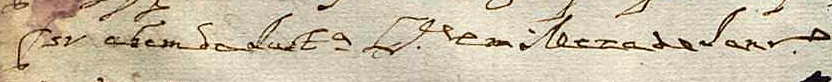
for a bem da Iust.a Lx.a em Meza de Ianr.o
